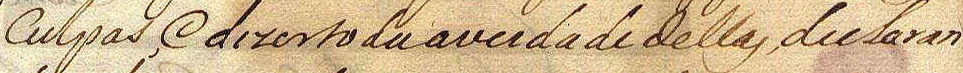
culpas, e dizer toda a verdade dellas, declaran
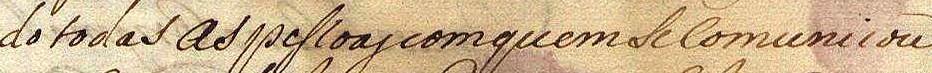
do todas as pessoas com quem Se comunicou
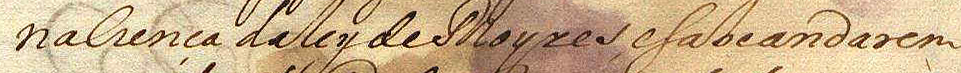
na crença da ley de Moyzes, e sabe andarem
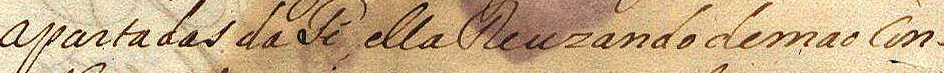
apartadas da Fé, ella Re uzando de mao con
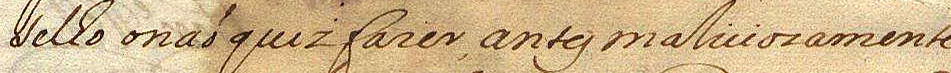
selho o naõ quiz fazer, antes maliciozamente
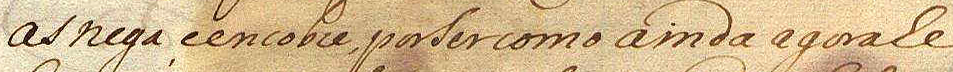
as nega e encobre, por ser como ainda agora he
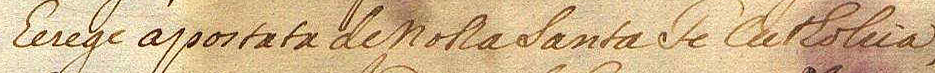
herege apostata de nossa Santa Fe Catholica,
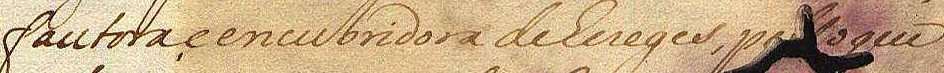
fautora, e encubridora de hereges, pe_lo que
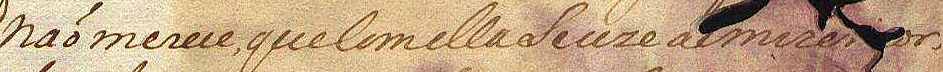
naõ merece, que com ella se uze ae mize__or
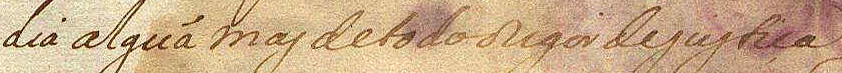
dia alguā mas de todo o rigor de justiça
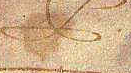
P.
